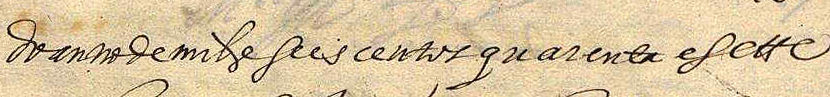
do anno de mil e seiscentos quarenta e sette
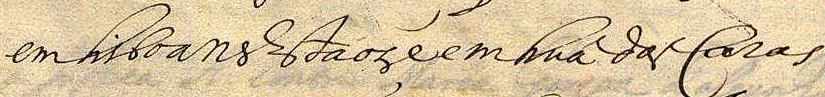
em lisboa nos Estaos, e em huā das Cazas
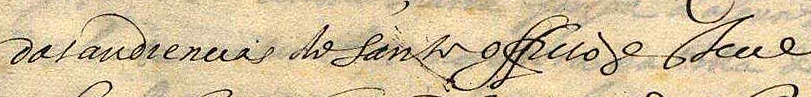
das audiencias do santo officio esteue
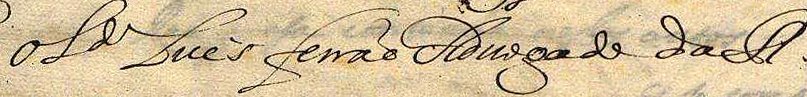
o Ldo Luis ferraõ Aduogado da R.
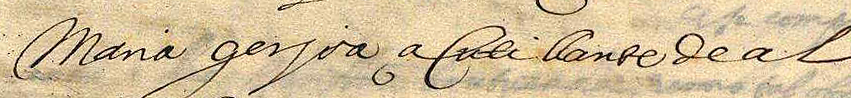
Maria gorjoa, a Cutillante de al
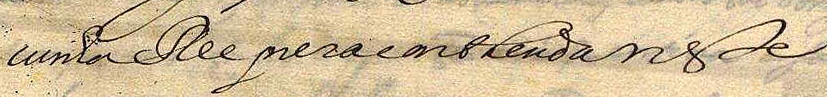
cunha Ree preza contheuda neste
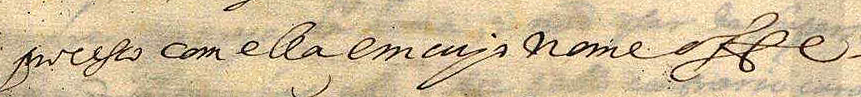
processo com ella, em cujo nome offe
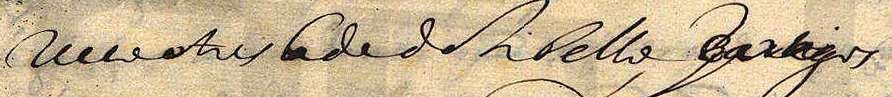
receo o treslado do Libello, e artigos
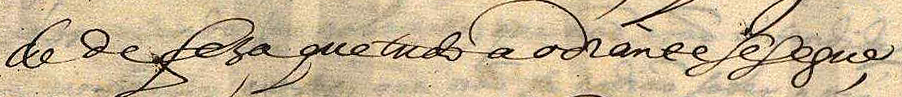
de defesa, que tudo ao diante se segue,
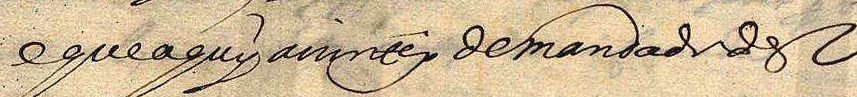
e que aquy aiuntey de mandado ds
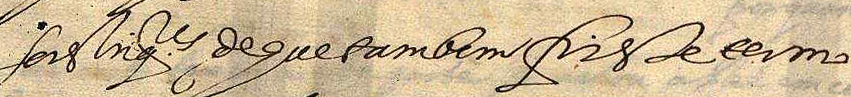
sors Inqres, de que tambem fis este termo
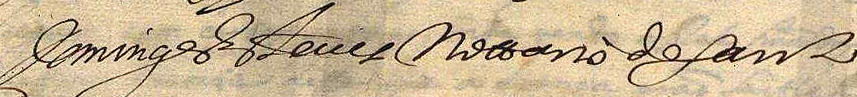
Domingos Esteues Nottario de santo
